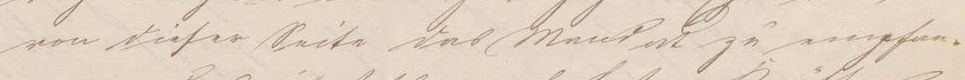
von dieser Seite das Mandat zu empfan-
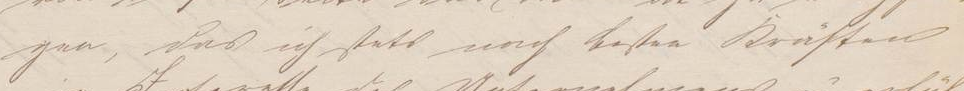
gen, das ich stets nach besten Kräften
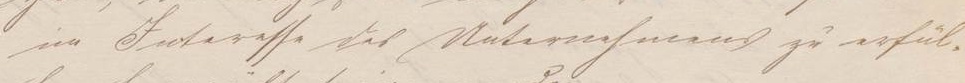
im Interesse des Unternehmens zu erfül-
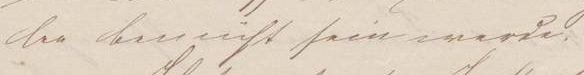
len bemüht sein werde.
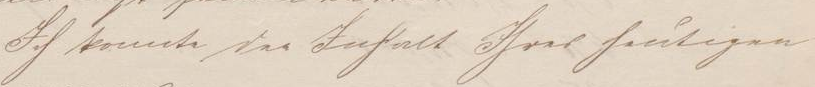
Ich konnte den Inhalt Ihres heutigen
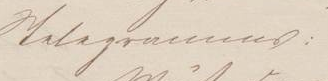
Telegrammes:
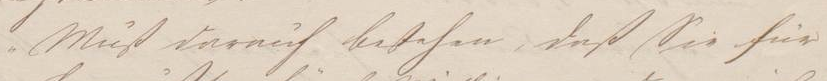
«Muß darauf bestehen, daß Sie für
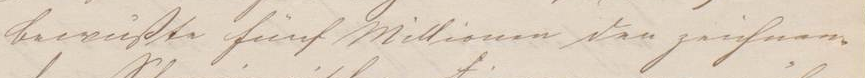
bewußte fünf Millionen den zeichnen-
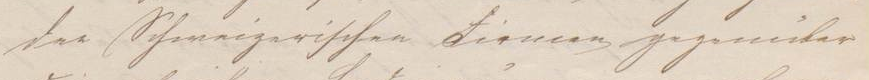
den Schweizerischen Firmen gegenüber
